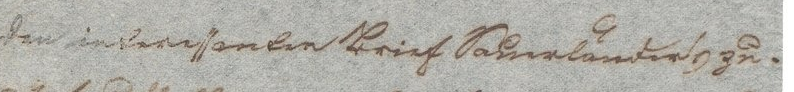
den interessanten Brief Sauerländer's zu-
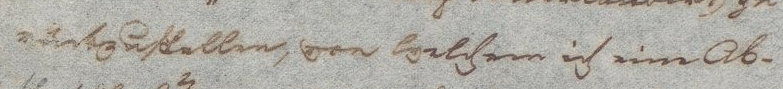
rückzustellen, von welchem ich eine Ab-
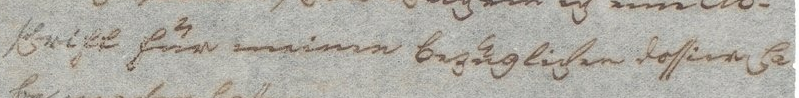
schrift für meinen bezüglichen Dossier ha-
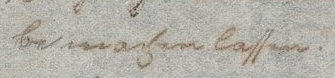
be machen lassen.
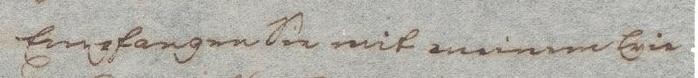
Empfangen Sie mit meinem wie-
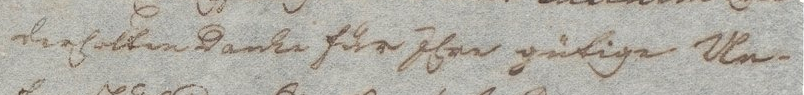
derholten Danke für Ihre gütige Un-
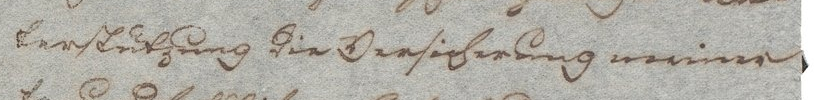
terstützung die Versicherung meiner
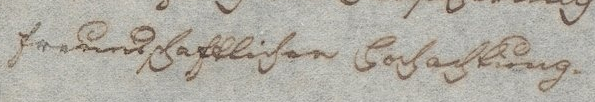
freundschaftlichen Hochachtung.
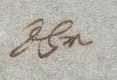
Escher
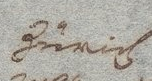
Zürich
